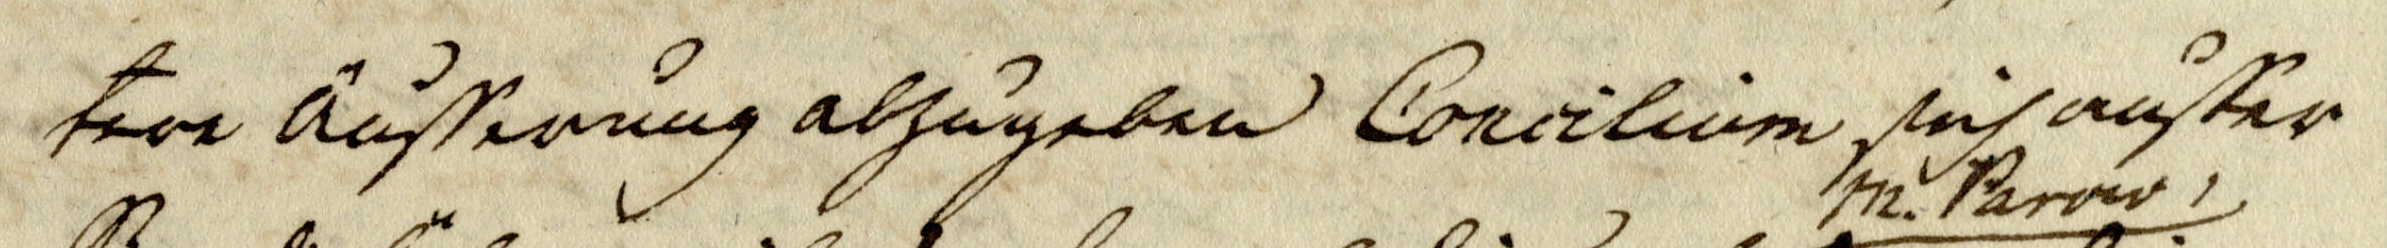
tere Äusserung abzugeben Concilium sich ausser
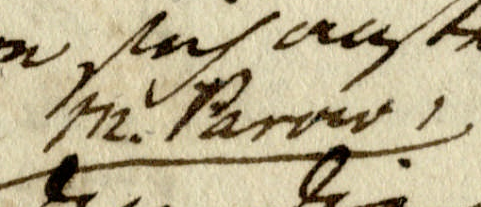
M. Parow
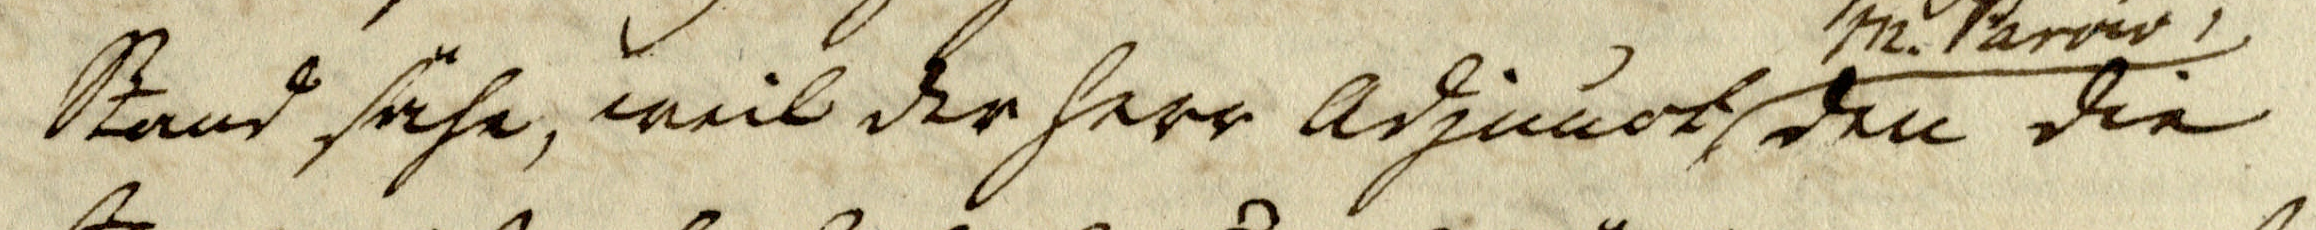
Stand sähe, weil der Herr Adjunct den die
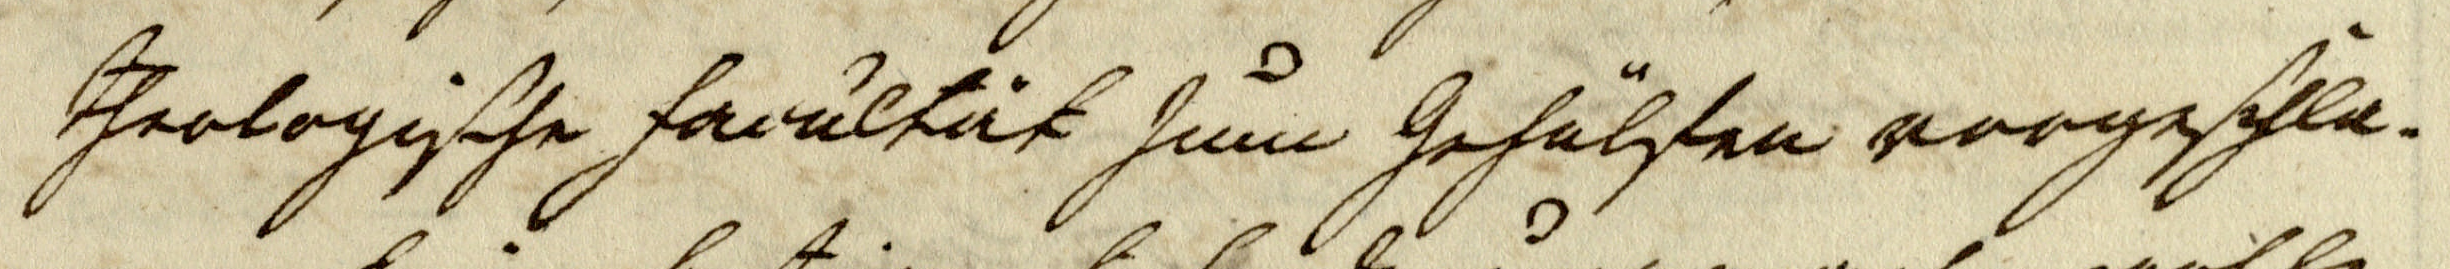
Theologische Facultät zum Gehülfen vorgeschla¬
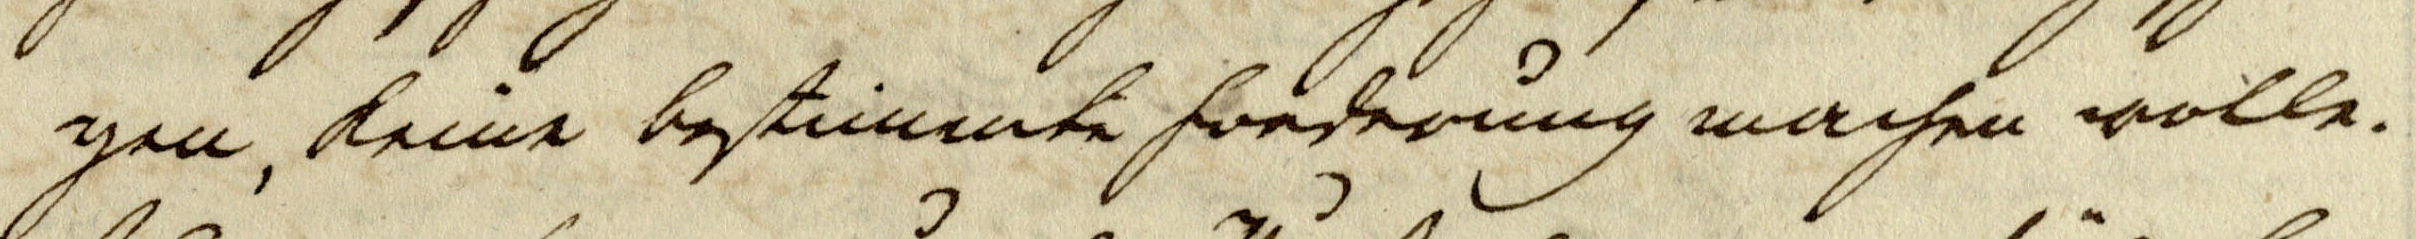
gen, keine bestimmte Forderung machen wolle.
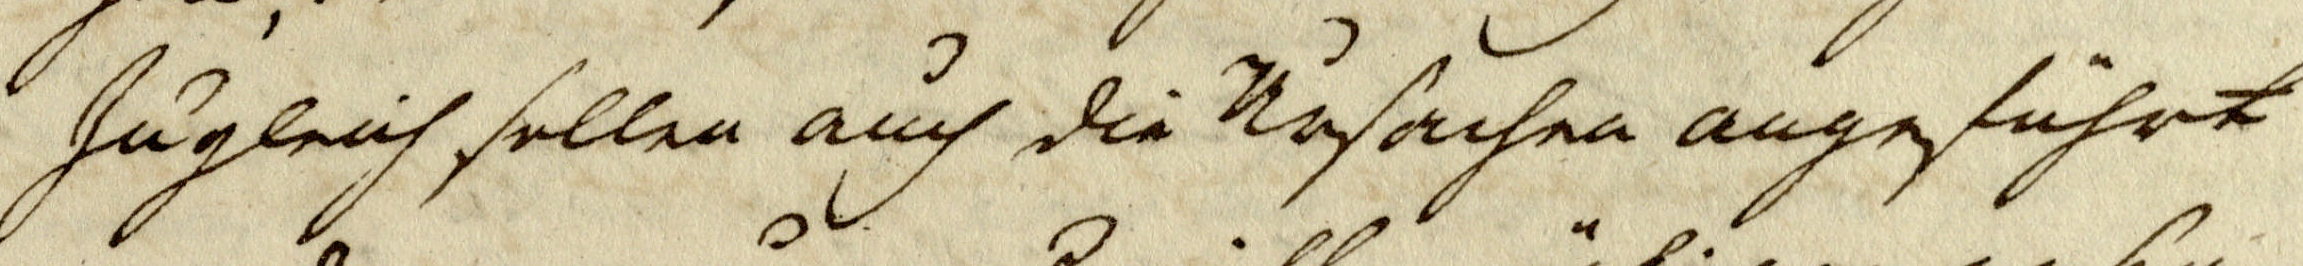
Zugleich sollen auch die Ursachen angeführt
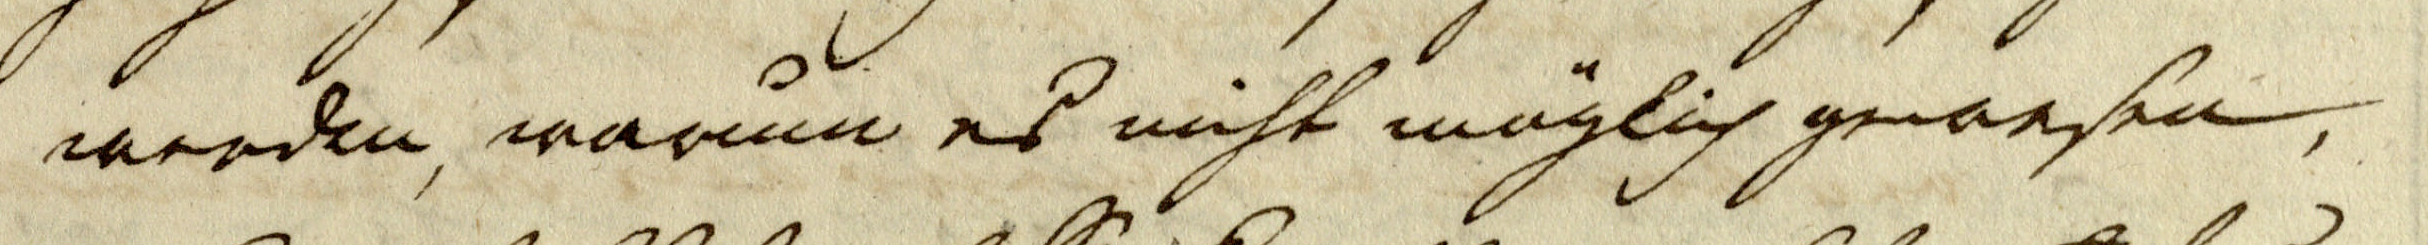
werden, warum es nicht möglich gewesen,
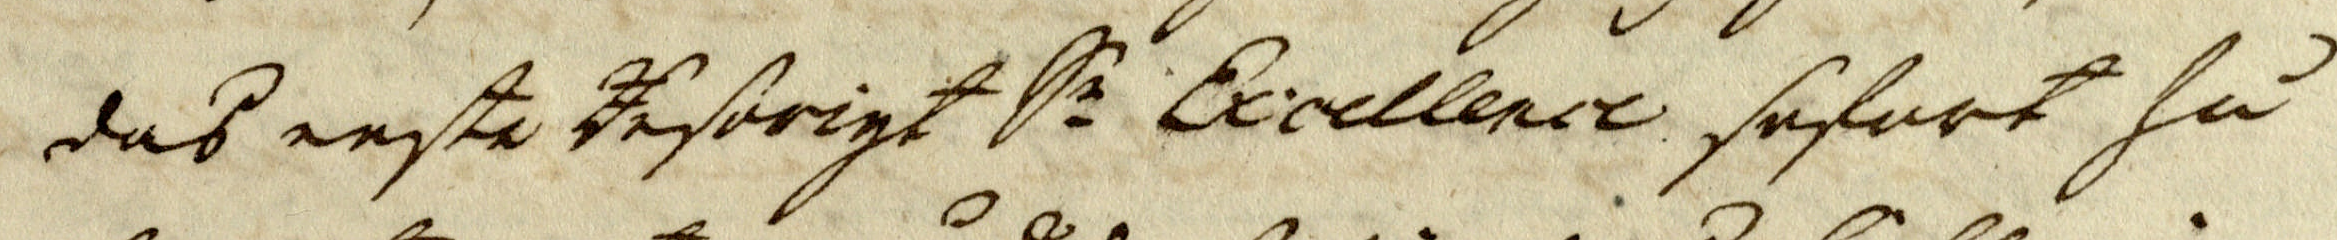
das erste Rescripts Sr Excellence sofort zu
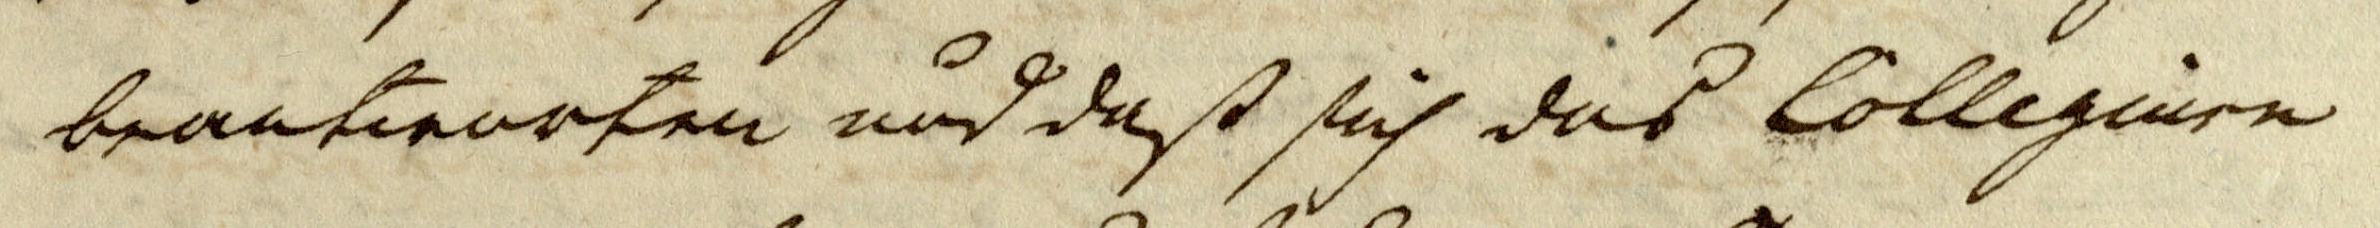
beantworten und daß sich das Collegium
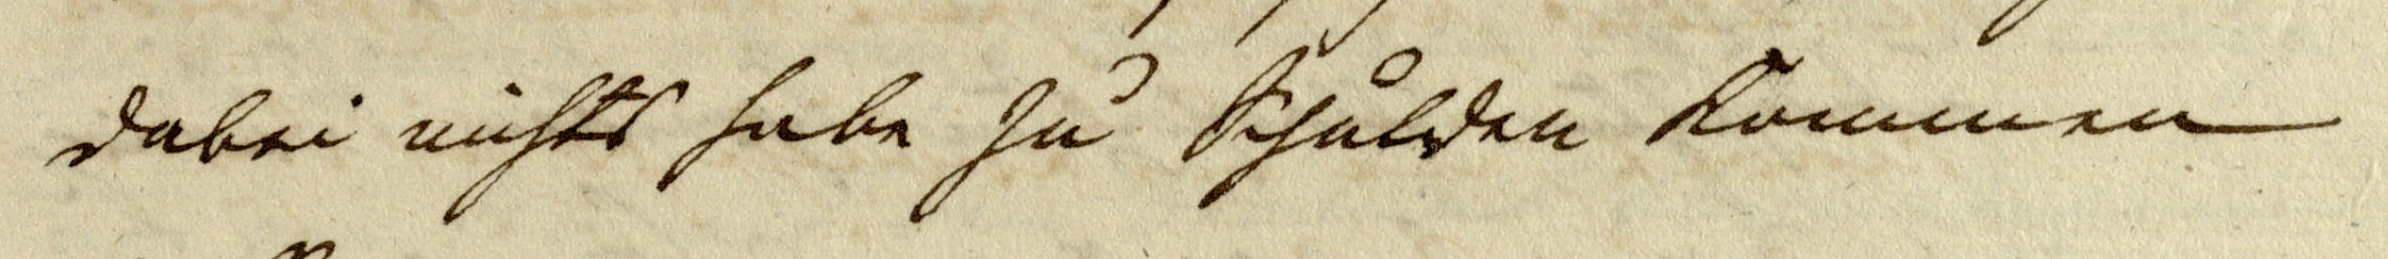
dabei nichts habe zu Schulden kommen
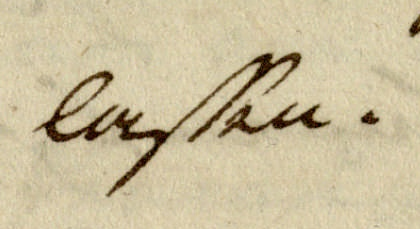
lassen.
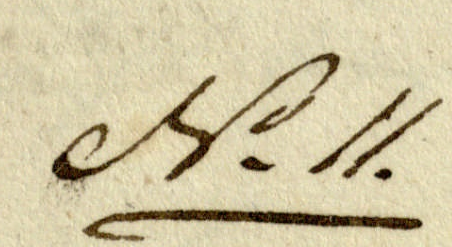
No 11.
